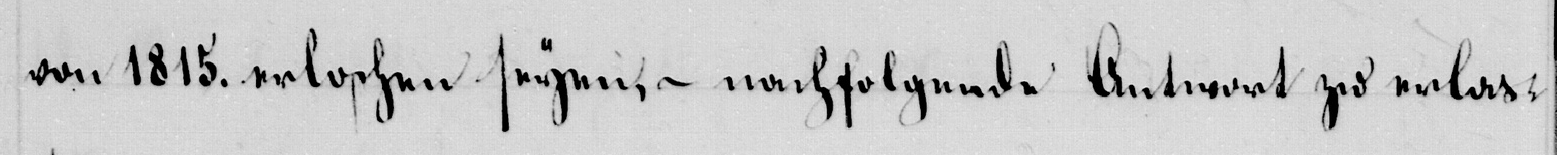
von 1815. erloschen seyen, – nachfolgende Antwort zu erlaß¬
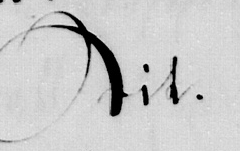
Tit.
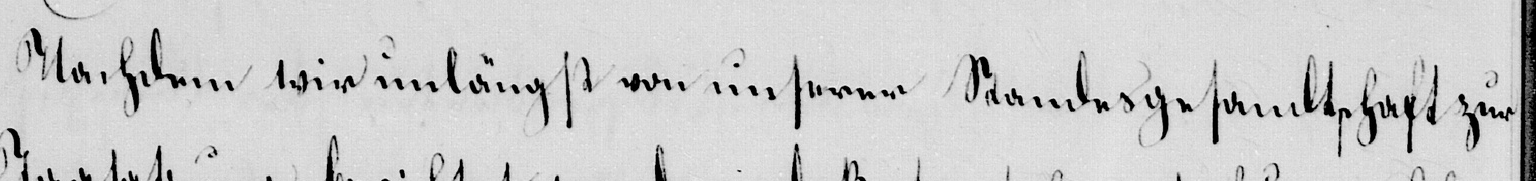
Nachdem wir unlängst von unserer Standesgesandtschaft zur
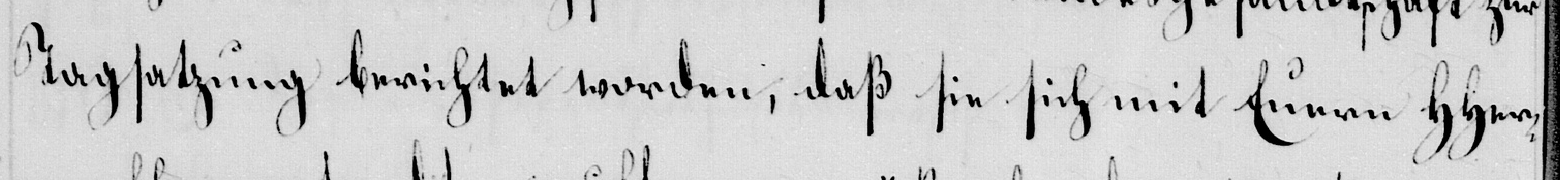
Tagsatzung berichtet worden, daß sie sich mit Euern HHer¬
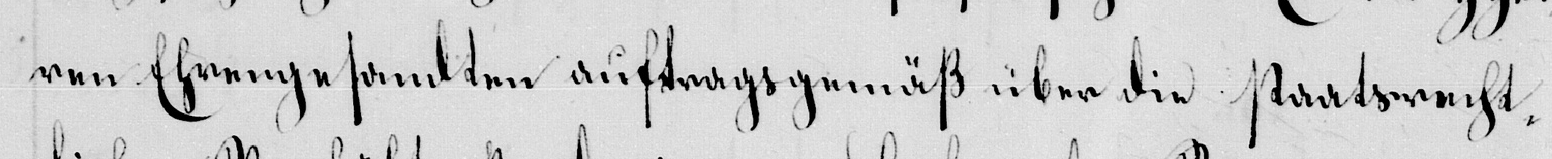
ren Ehrengesandten auftragsgemäß über die staatsrecht¬
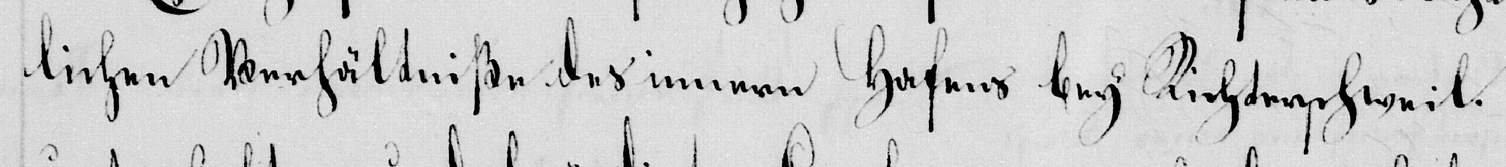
lichen Verhältniße des innern Hafens bey Richterschweil
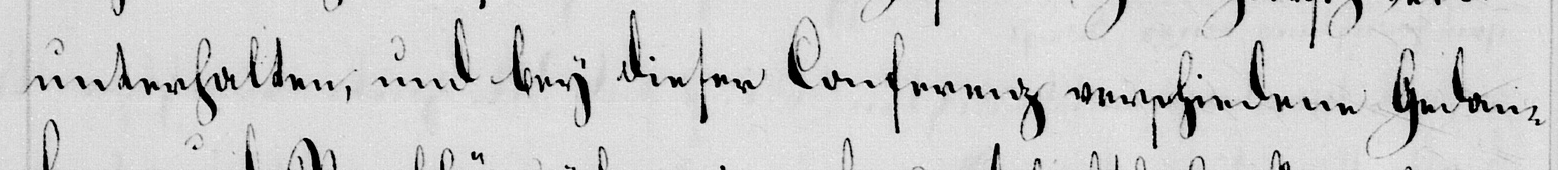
unterhalten, und bey dieser Conferenz verschiedene Gedan¬
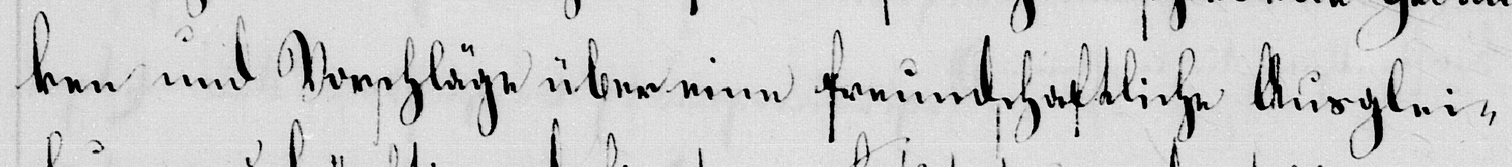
ken und Vorschläge über eine freundschaftliche Ausglei¬
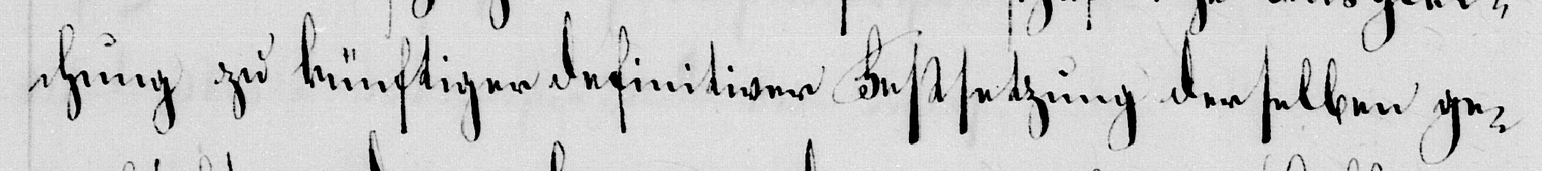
chung zu künftiger definitiver Festsetzung derselben ge¬
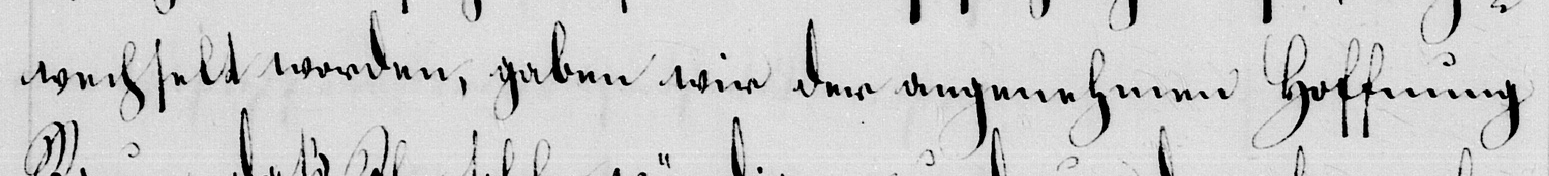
wechselt worden, gaben wir der angenehmen Hoffnung
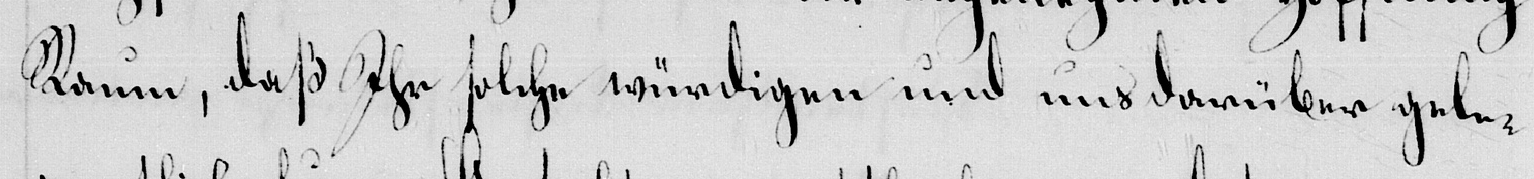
Raum, daß Ihr solche würdigen und uns darüber gele¬
